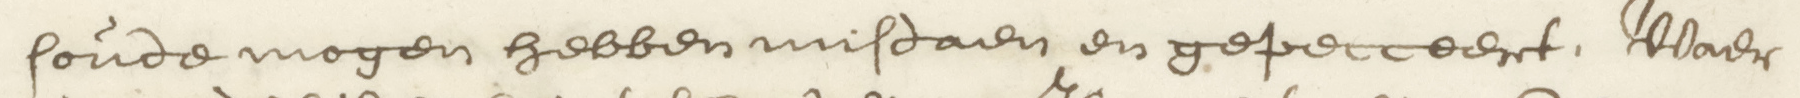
soude mogen hebben misdaen en gepecceert. Waer
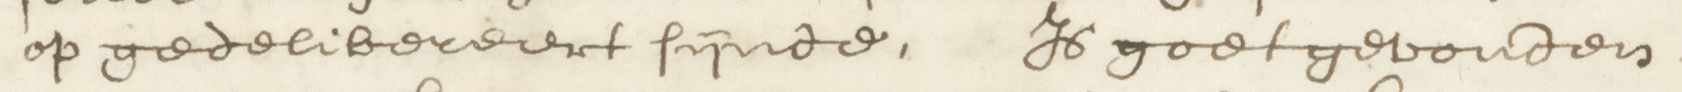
op gedelibereert sijnde, Is goetgevonden
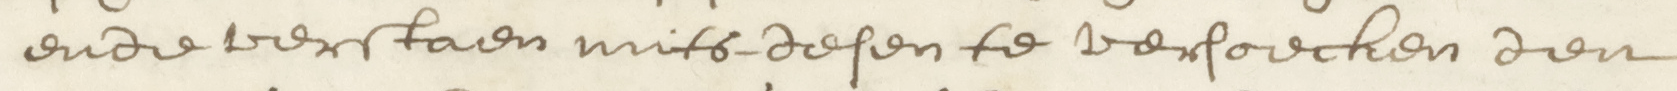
ende verstaen mits desen te versoecken den
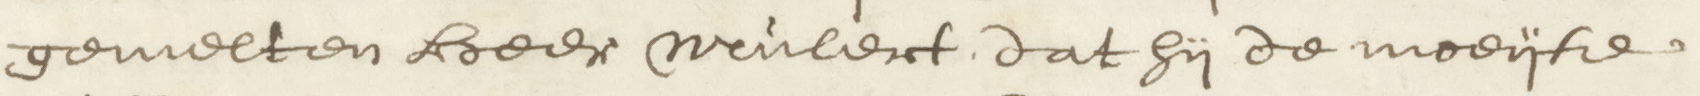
gemelten Heer Mulert, dat hij de moeijte
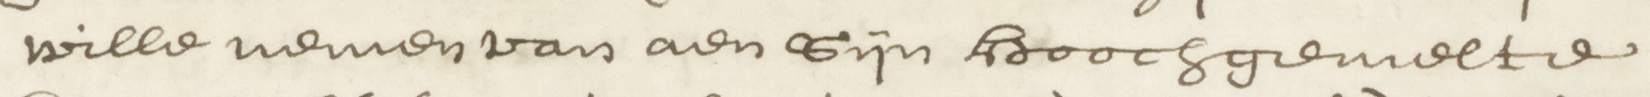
wille nemen van aen Sijn Hoochgemelte
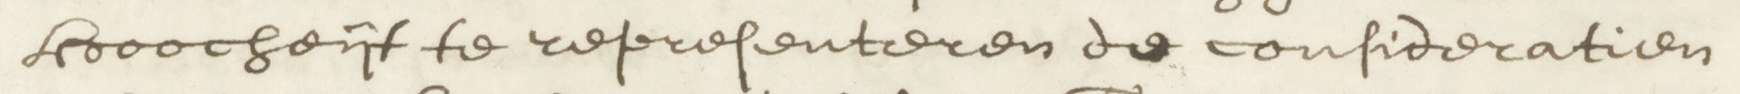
Hoocheijt te representeren de consideratien
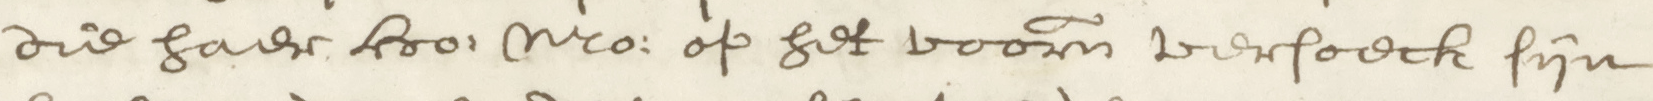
die haer Ho:Mo: op het voorn versoeck sijn
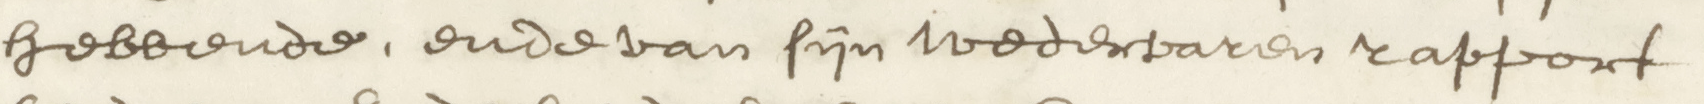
hebbende, ende van sijn wedervaren rapport
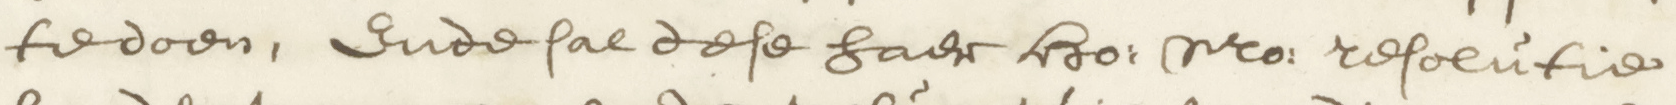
te doen. Ende sal dese haer Ho:Mo: resolutie
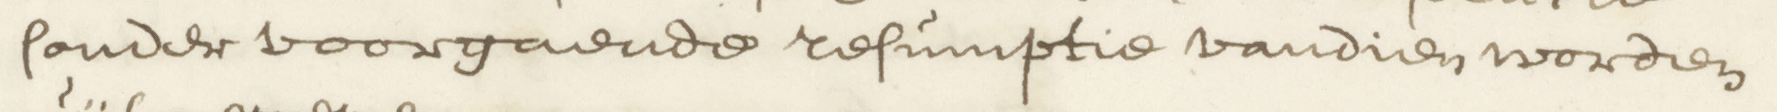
sonder voorgaende resumptie vandien worden
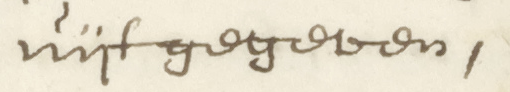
uijtgegeven.
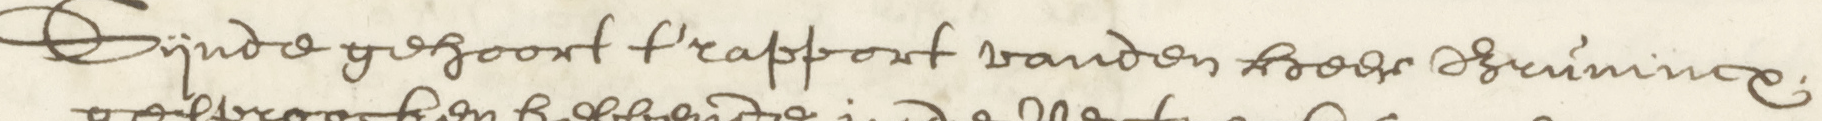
Sijnde gehoort t'rapport vanden Heer Brunincx,
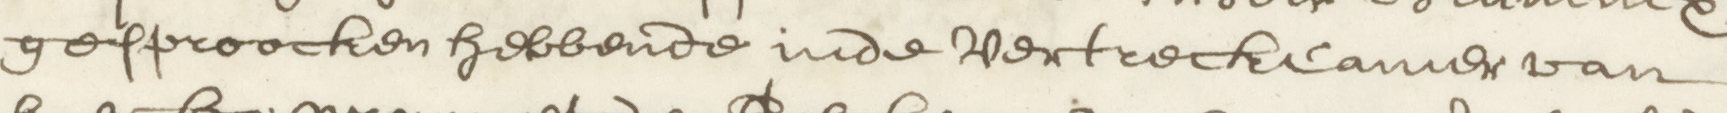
gesproocken hebbende inde VertreckCamer van
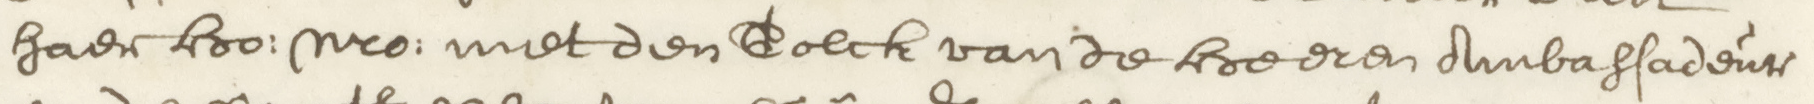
haer Ho:Mo: met den Tolck van de heeren Ambassadeur
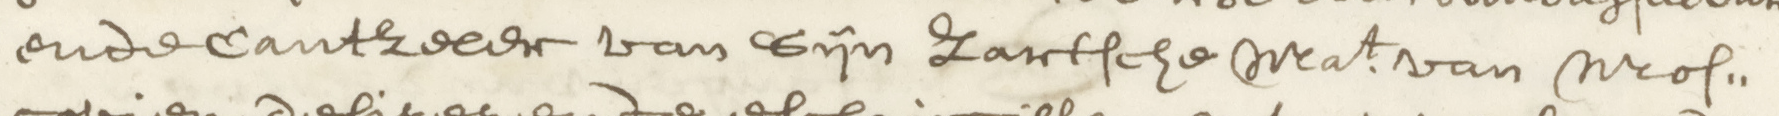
ende Cantzeler van Sijn Zartsche Mat. van Mos,,
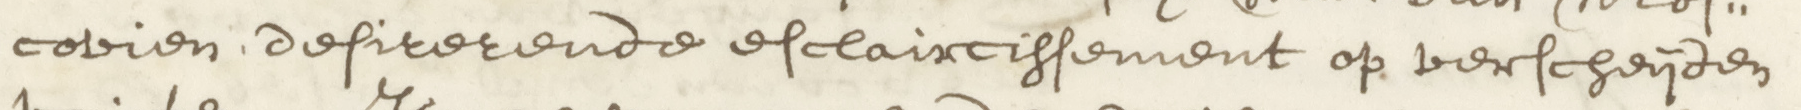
covien, desirerende esclaircissement op verscheijden
